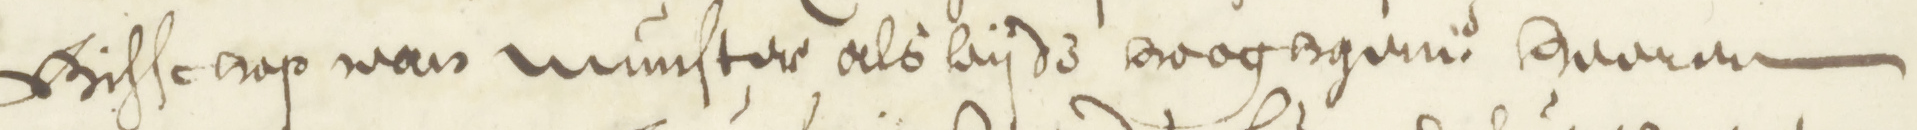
Bisschop van Munster als bij de hooghgeme Heeren
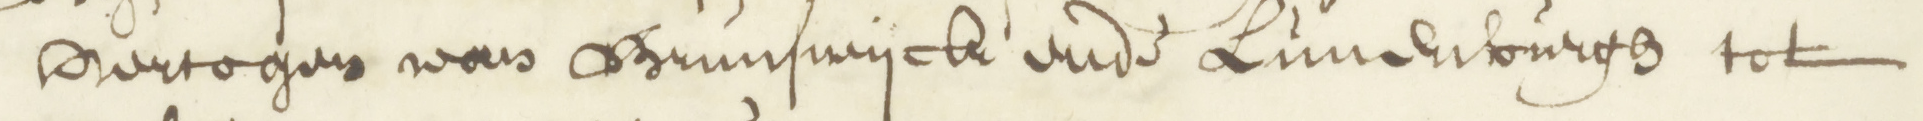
Hertogen van Brunswijck ende Lunenburgh tot
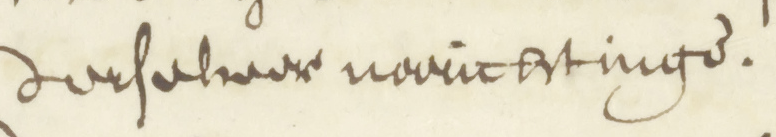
derselver narichtinge.
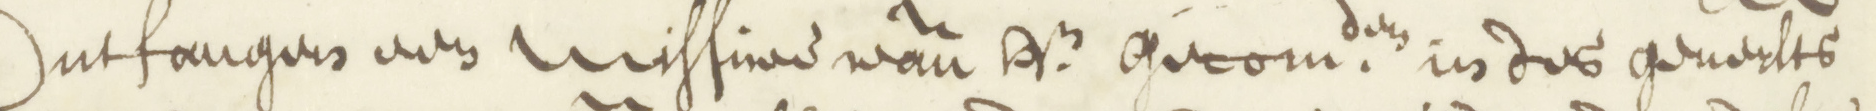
Ontfangen een missive van Hn. Gecomden. in des Generalts
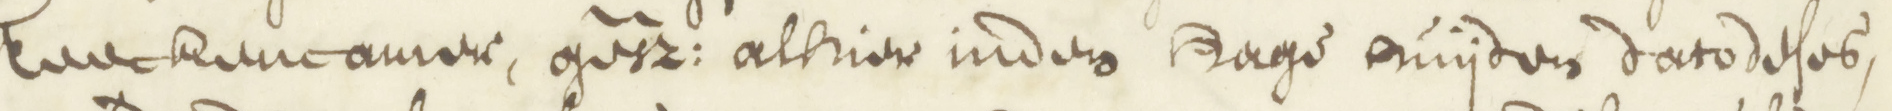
reeckencamer, gesr: alhier inden Hage huijden dato deses
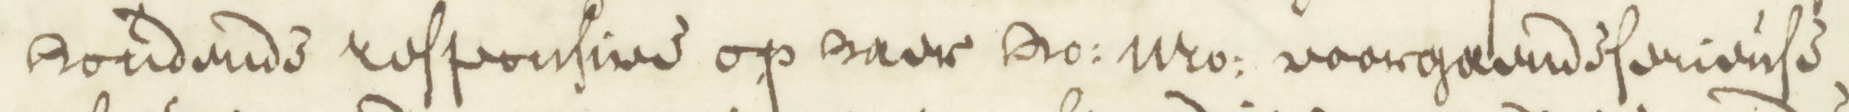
houdende responsive op haer Ho:Mo: voorgaende serieuse
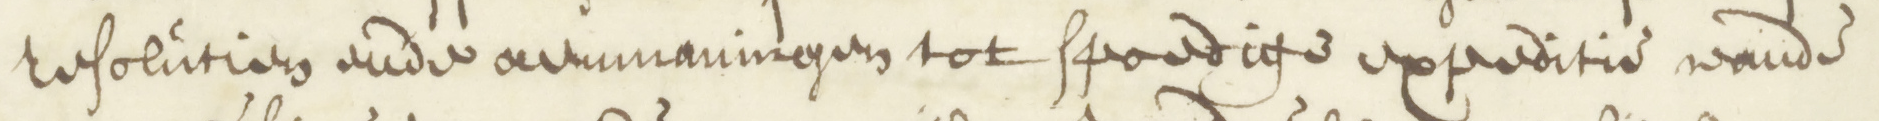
resolutien ende aenmaningen tot spoedige expeditie vande
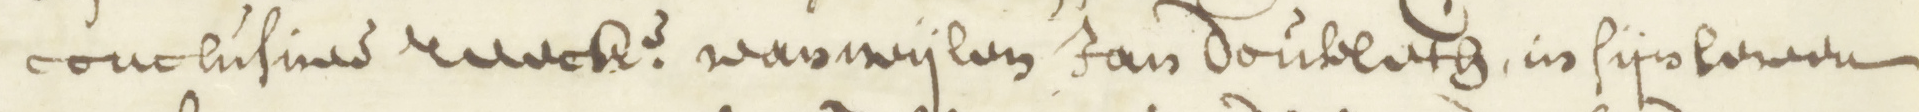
conclusive reecke. van wijlen Jan doubleth, in sijn leven
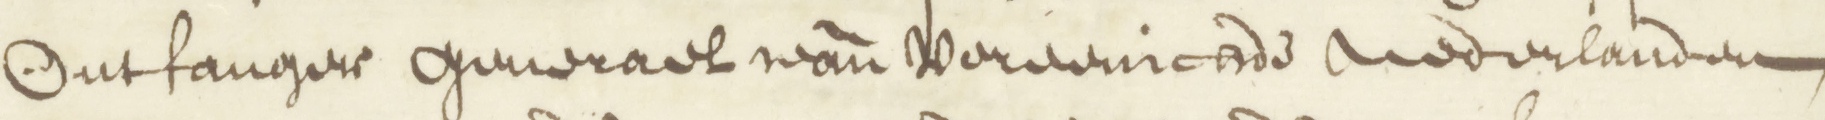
Ontfanger Generael van Vereenichde Nederlanden
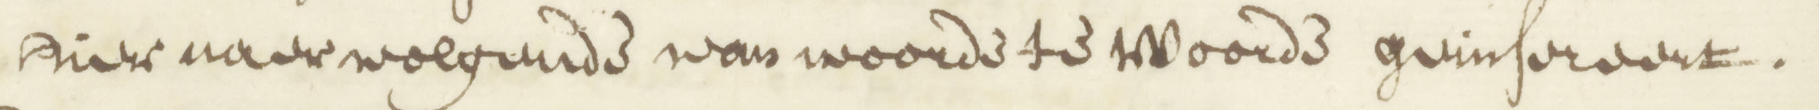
hier naer volgende van woorde te Woorde geinsereert.
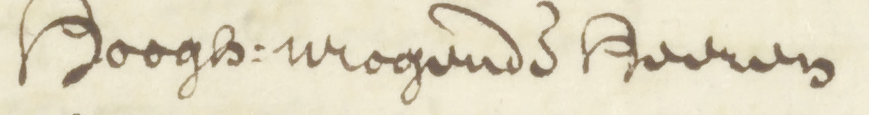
Hoogh mogende Heeren
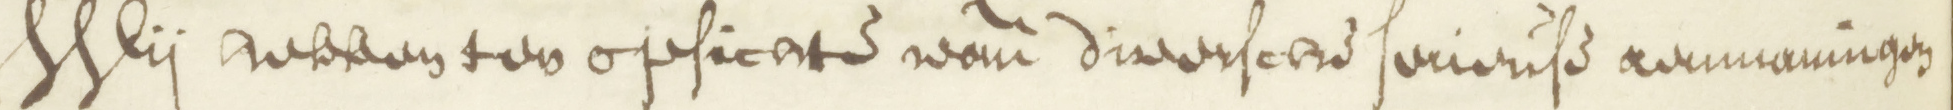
Wij hebben ten opsichte van diversche serieuse aenmaningen
